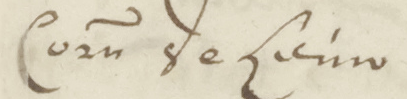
Corn de Leuw
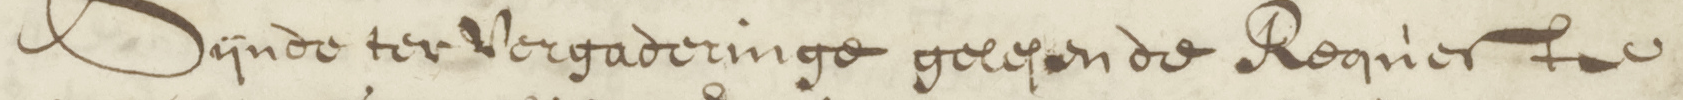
Sijnde ter Vergaderinge gelesen de Requeste
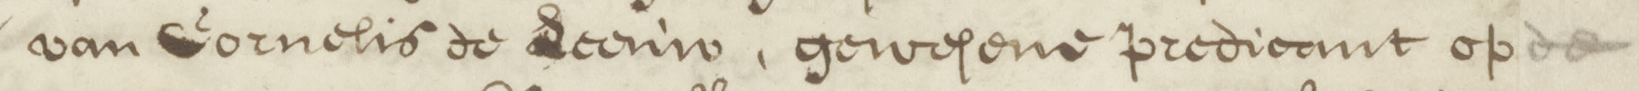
van Cornelis de Leeuw, gewesene predicant op de
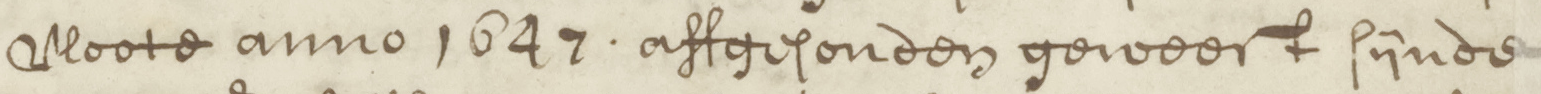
Vloote anno 1647, affgesonden geweest sijnde,
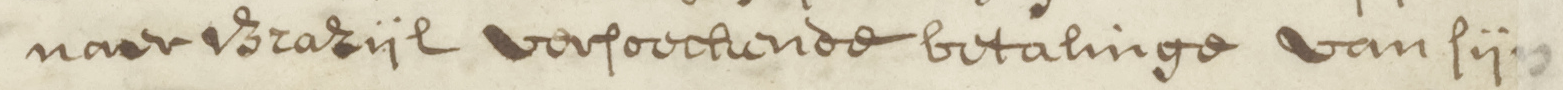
naer Brazijl, versoeckende betalinge van sijn
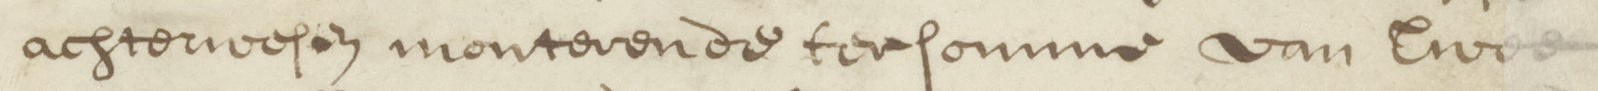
achterwesen monterende ter somme van twee
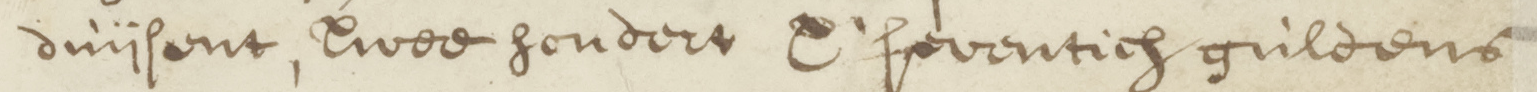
duijsent, twee hondert T‛seventich guldens,
